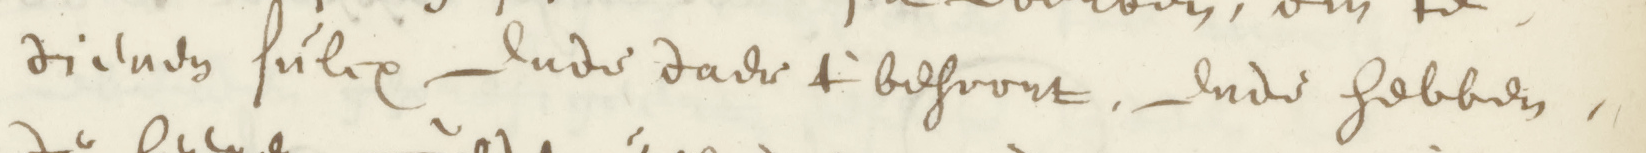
dienen sulcx ende daer t'behoort, ende hebben,
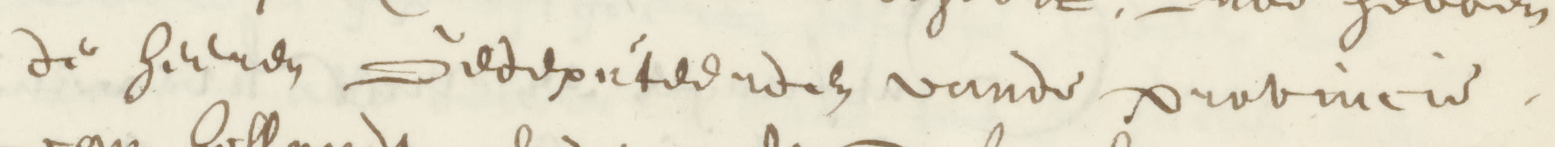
de heeren Gedeputeerden vande provincie
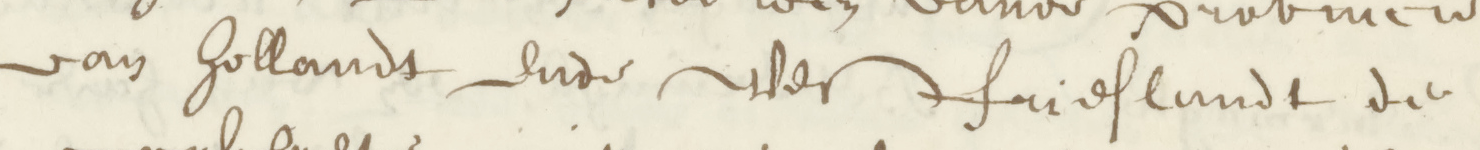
van hollandt ende Westfrieslandt de
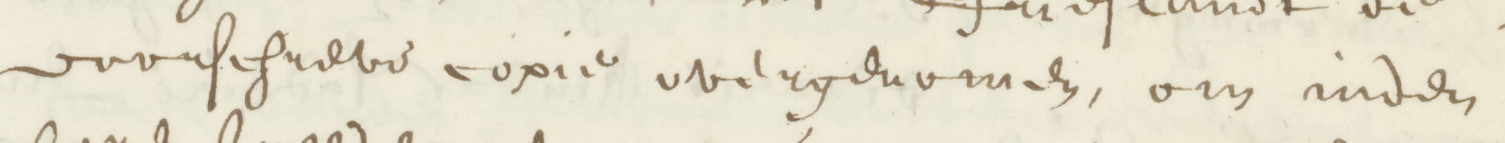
voorschreve copie overgenomen, om inden
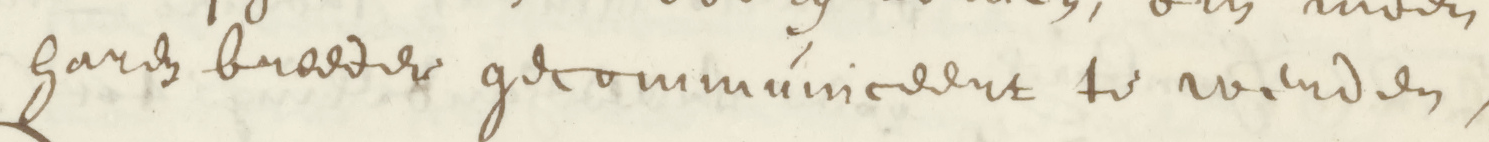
haren breeder gecommuniceert te werden
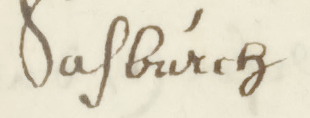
Sasburg
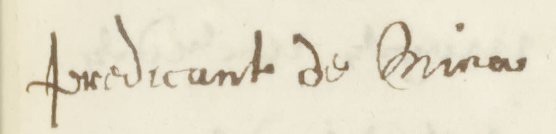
Predicant de Mina
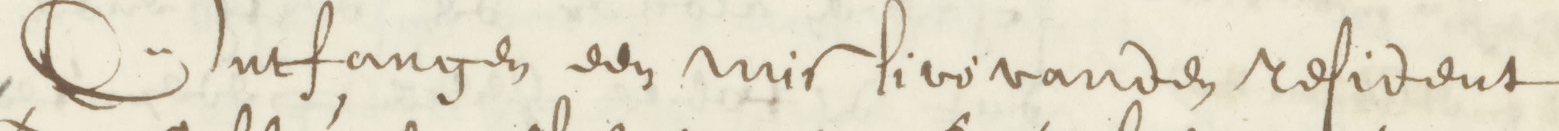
Ontfangen een missive vanden resident
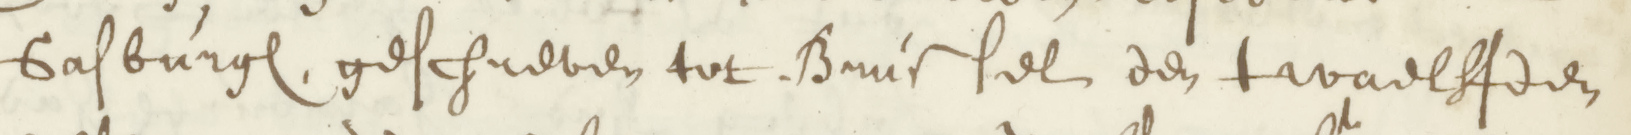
Sasburgh, geschreven tot Brussel den twaelffden
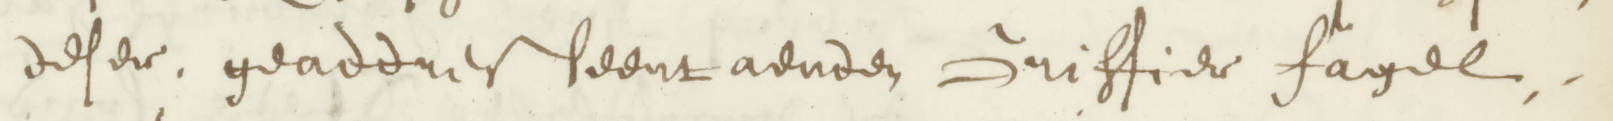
deser, geaddresseert aenden Griffier Fagel,
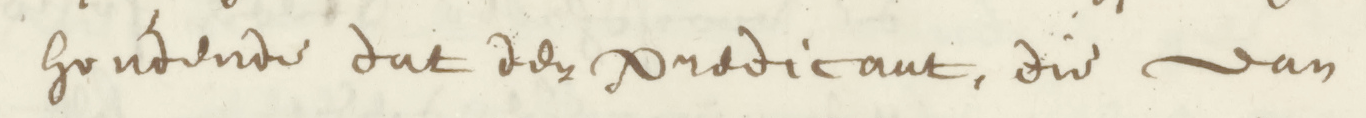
houdende dat den predicant, die van
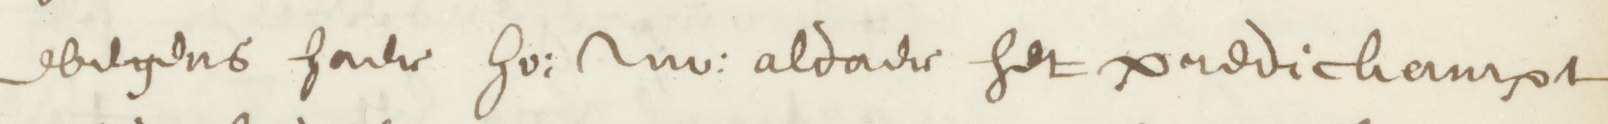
wegens haer ho:mo: aldaer het predickampt
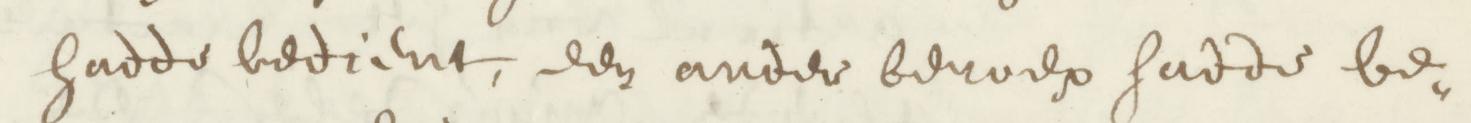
hadde bedient, een ander beroephadde be„
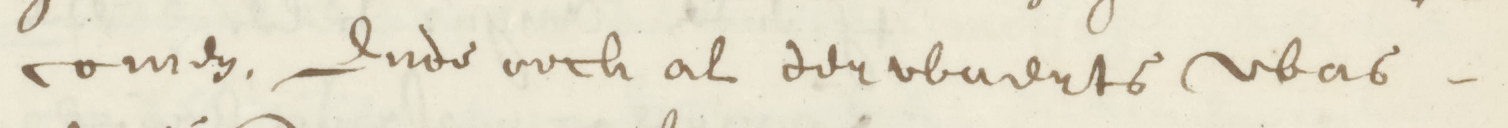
comen, ende oock al derwaerts was
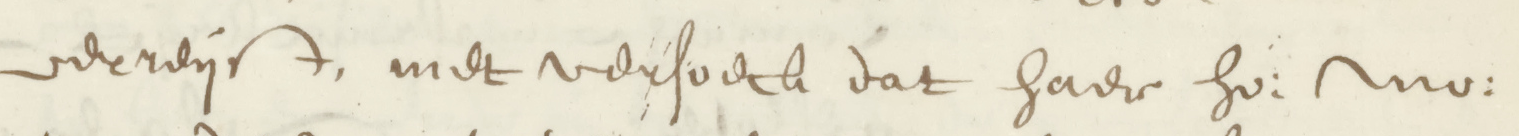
verreijst, met versoeck dat haer ho:mo:
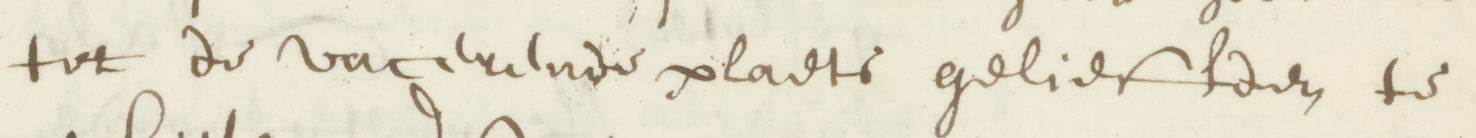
tot de vacerende plaets gelieffden te
